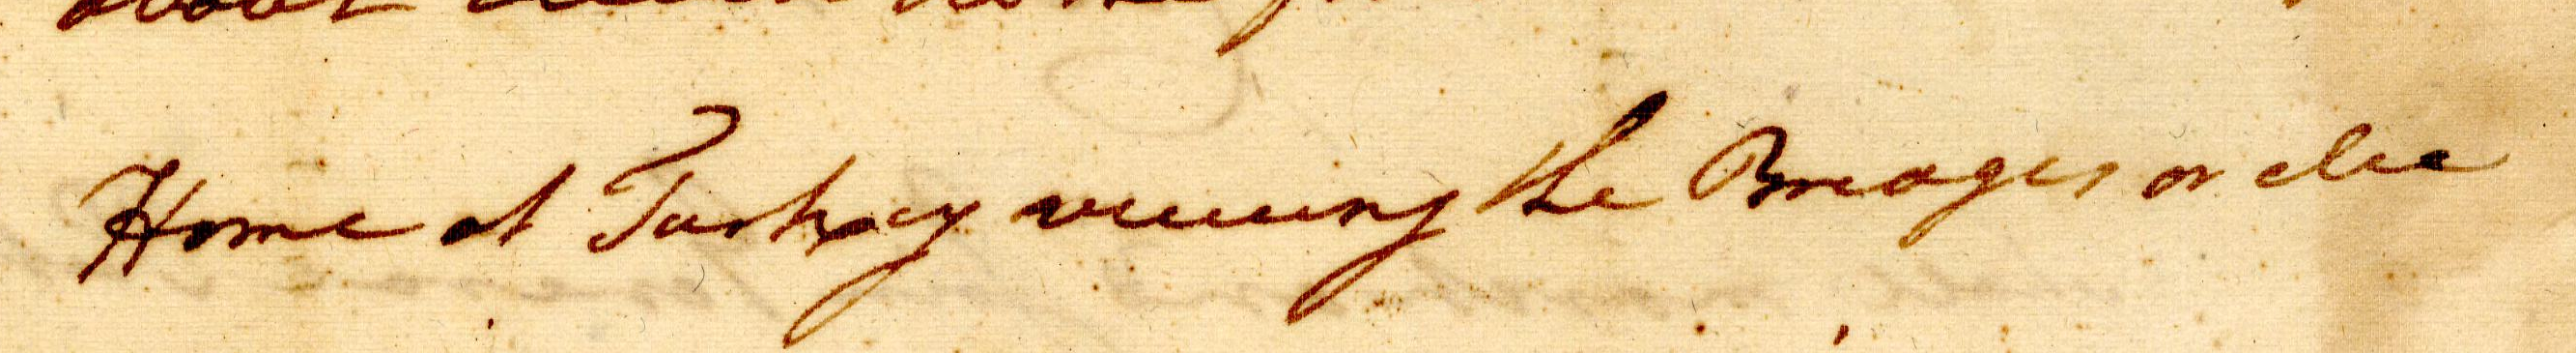Home at Turkey receiving the Brages or else
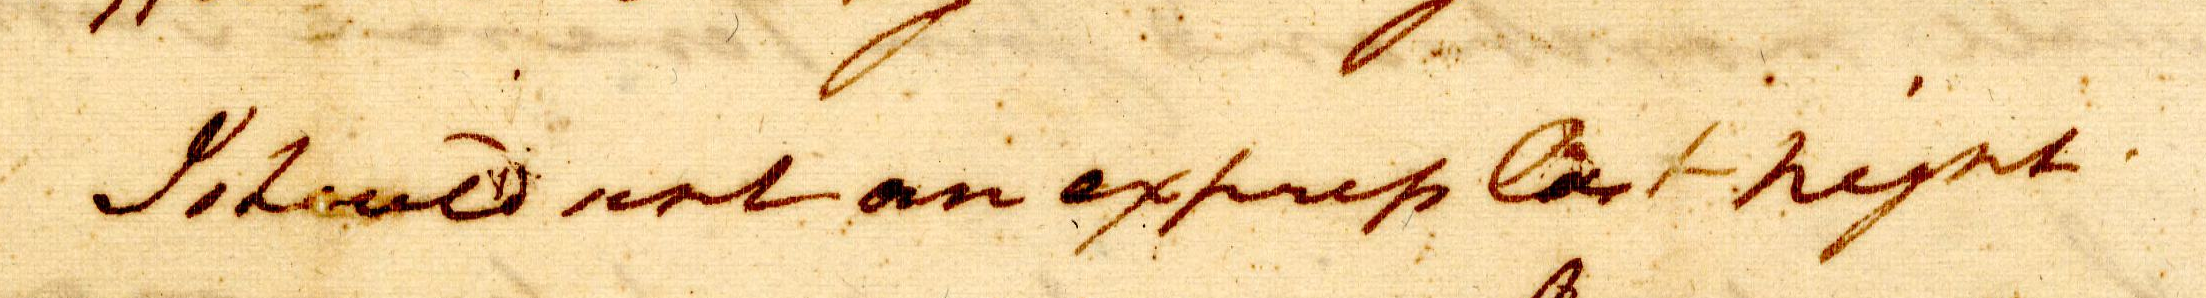I should sent an express last night.
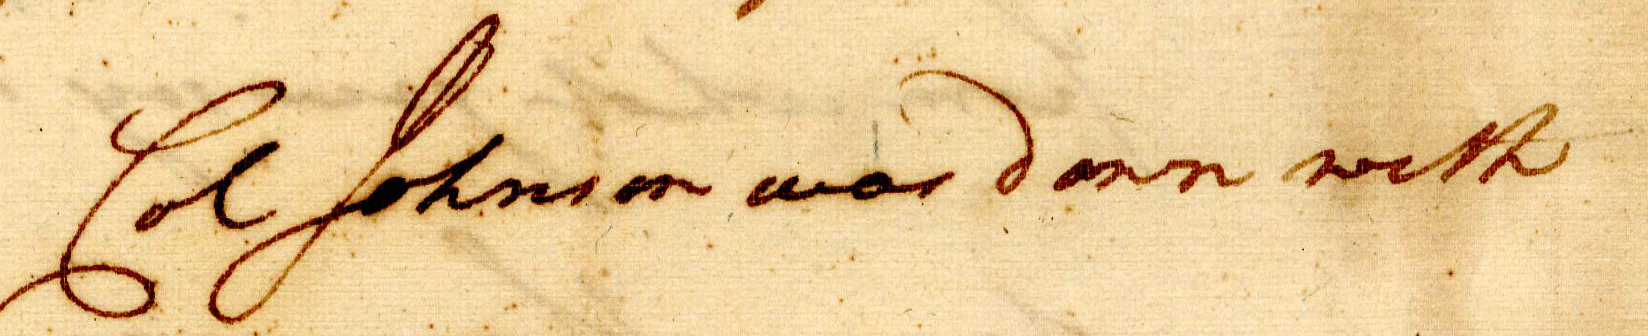Col Johnson was down with
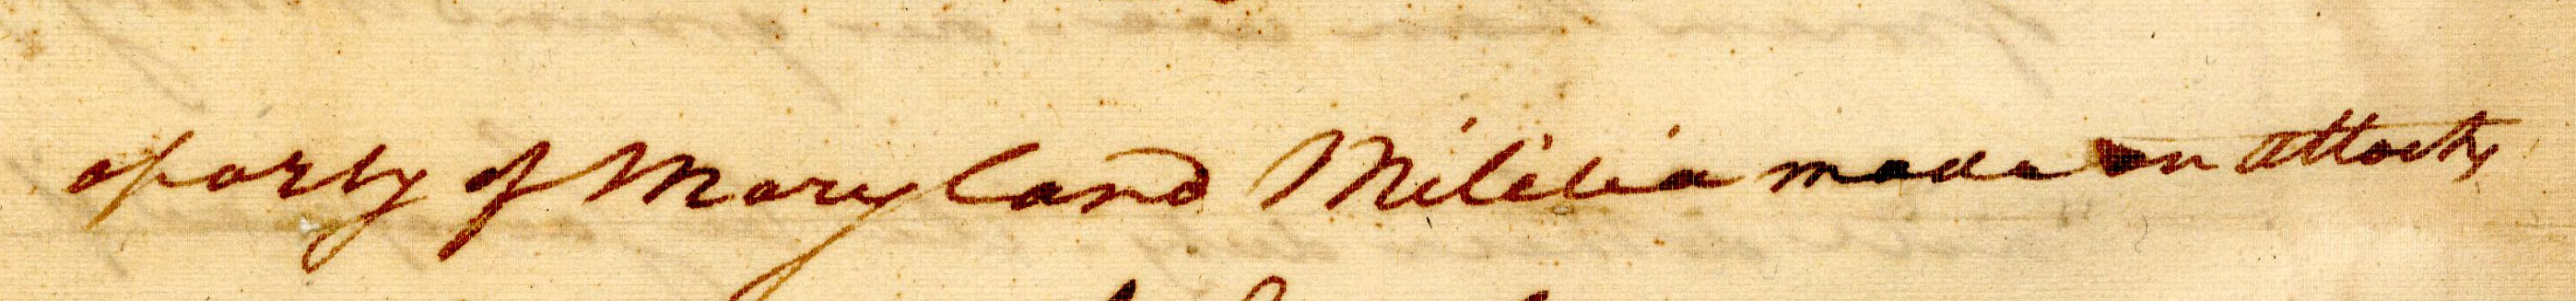a party of Maryland Militia made an attack
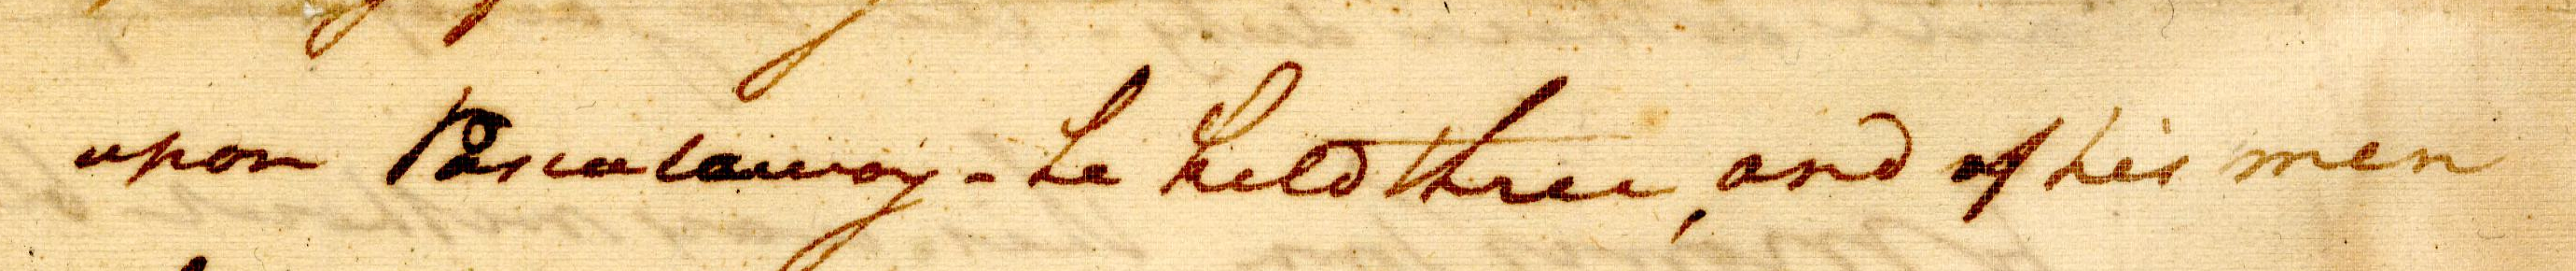upon Piscataway. he kild three, and if his men
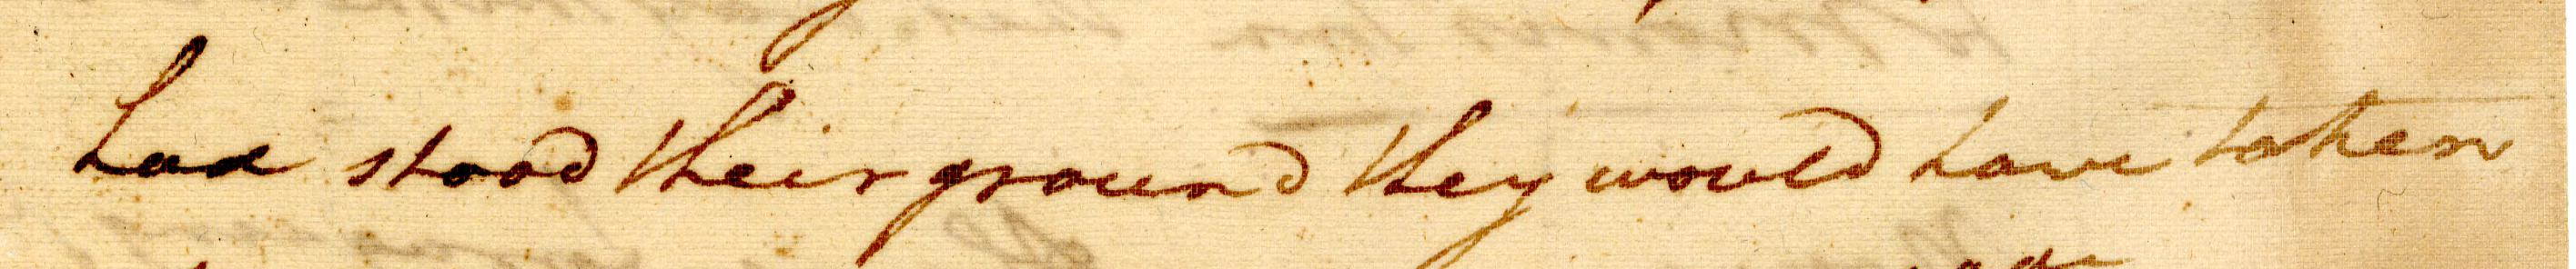had stood their ground they would have taken
